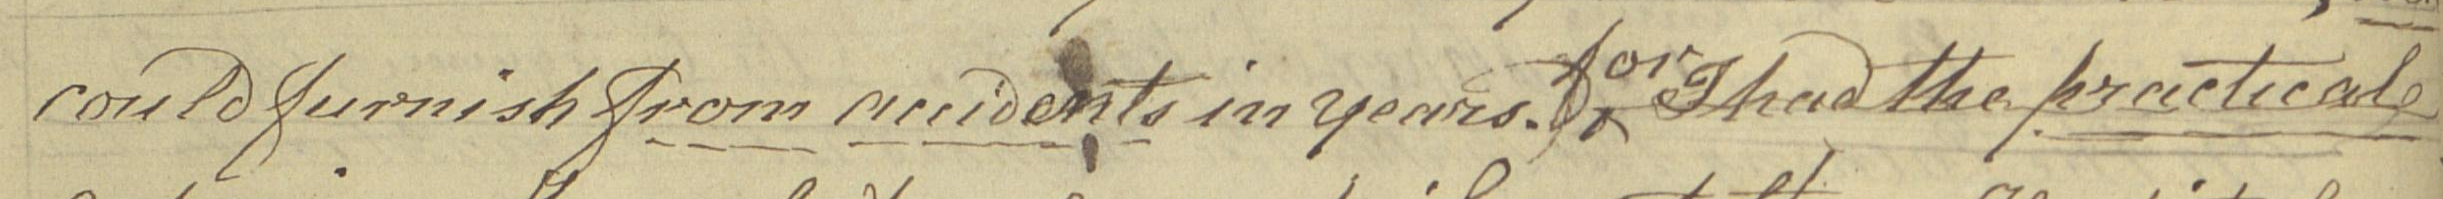could furnish from accidents in years. ^ I had the practical
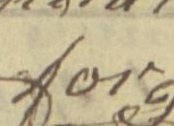for
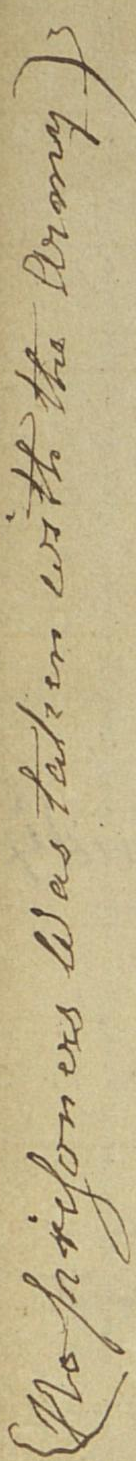(No prisoners Was taken with the Army.)
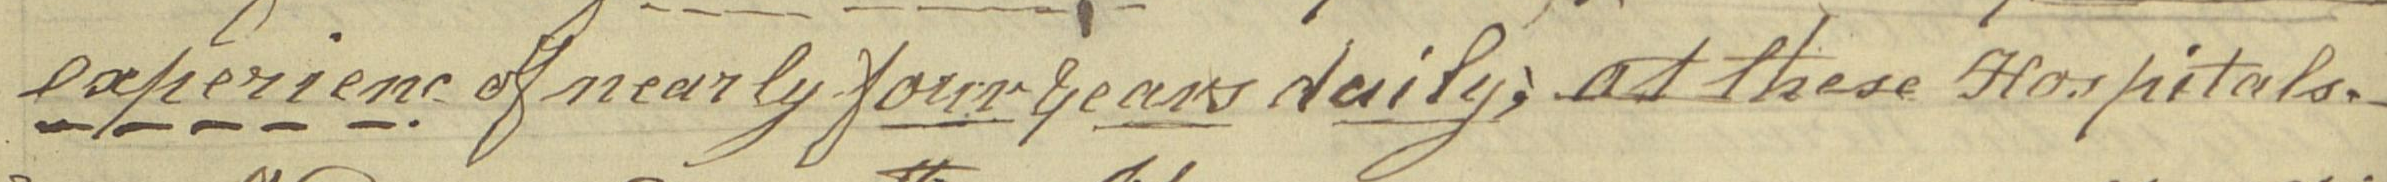experience of nearly four years daily at these Hospitals.
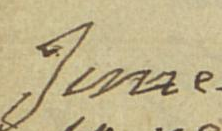June.
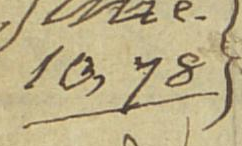10, 78
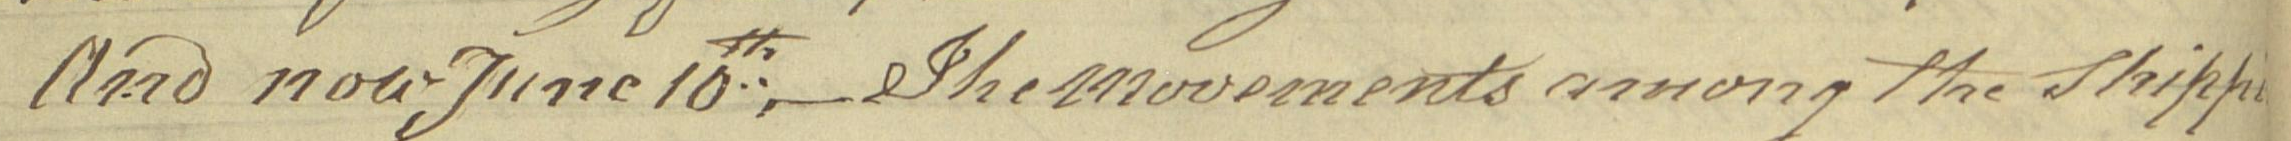And now June 10^th. The movements among the Shipp-
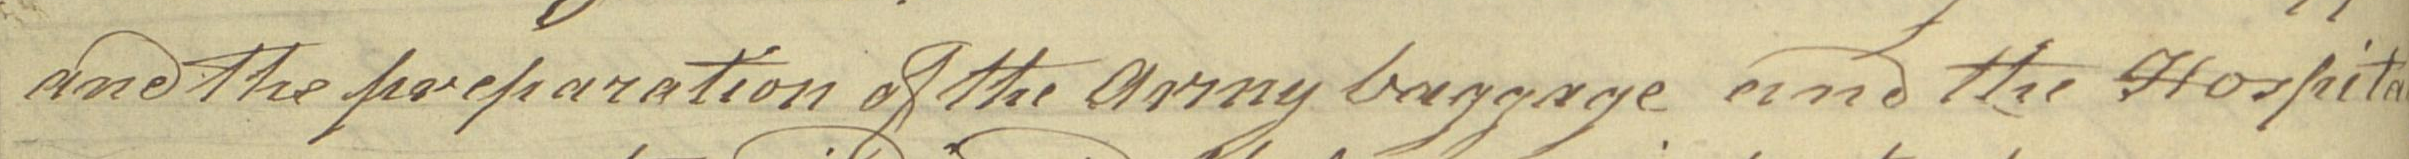and the preparation of the Army baggage, and the Hospita-
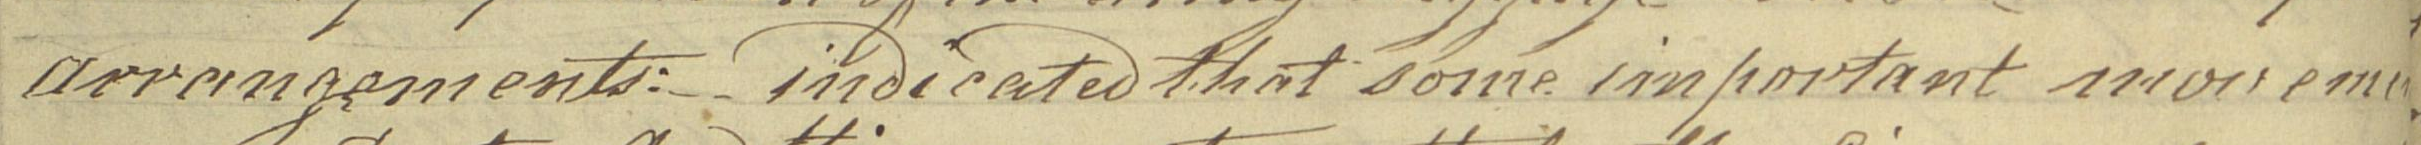arrangements: indicated that some important moveme-
